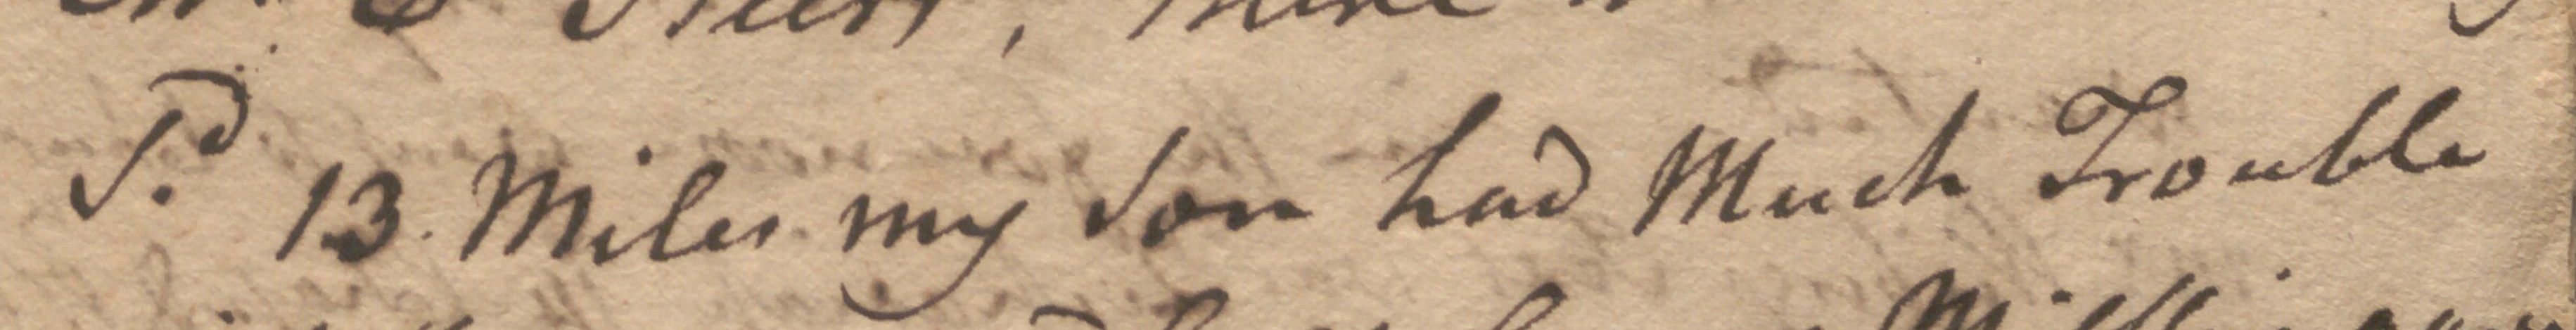S^d. 13. Miles my son had Much Trouble
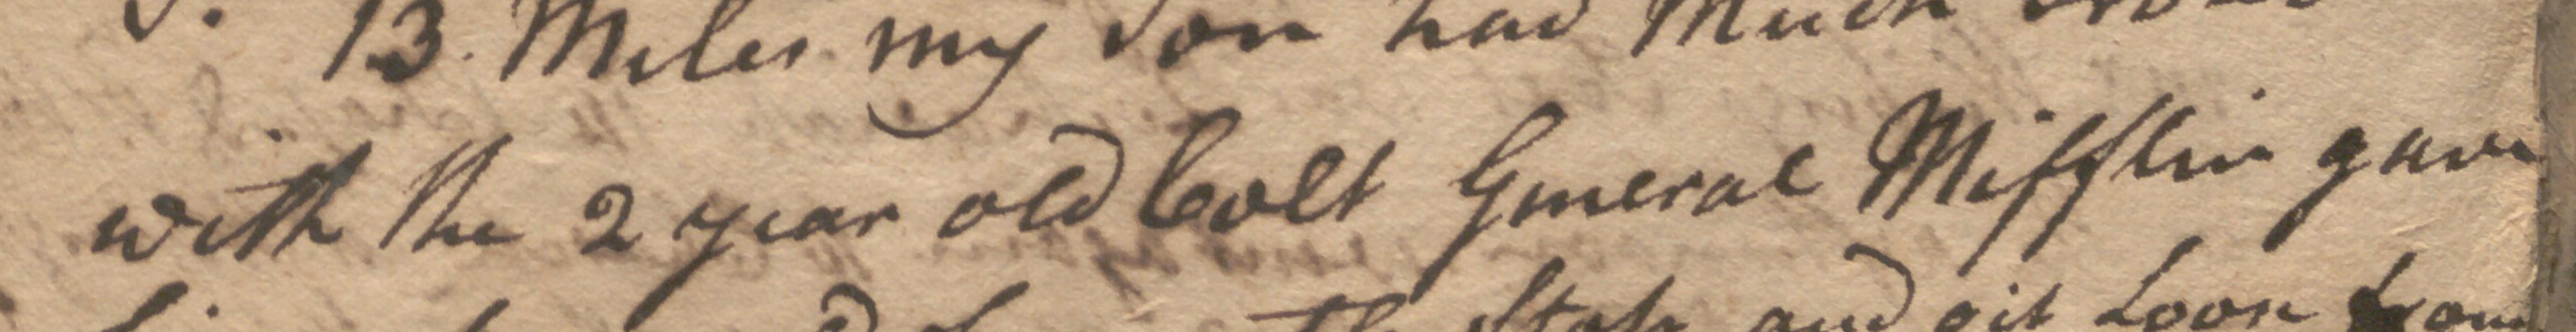with the 2 year old Colt General Mifflin gave
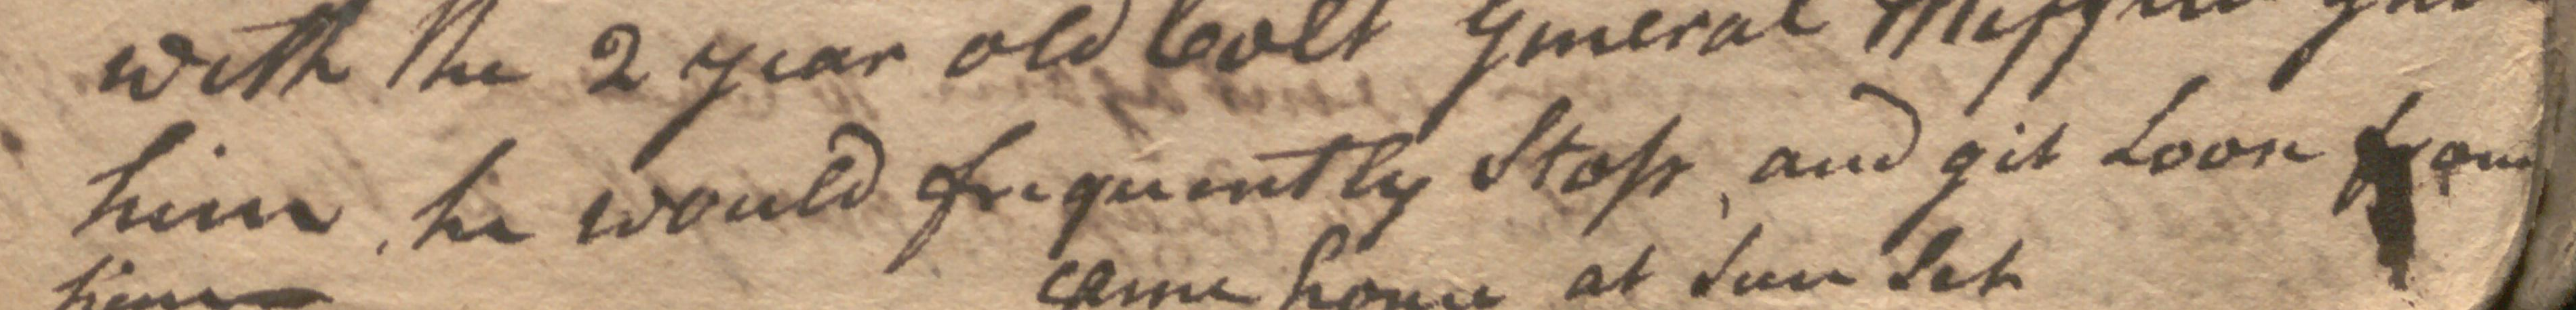him, he would frequently Stop, and git Loose from
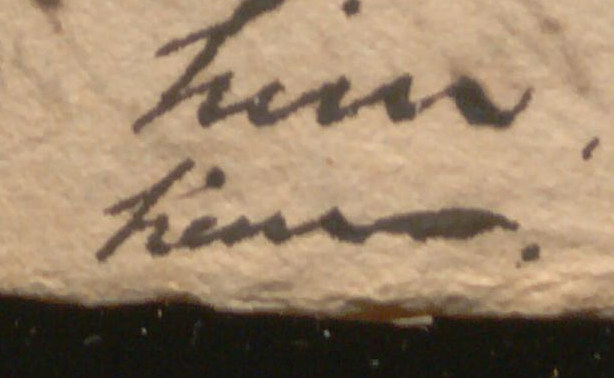him
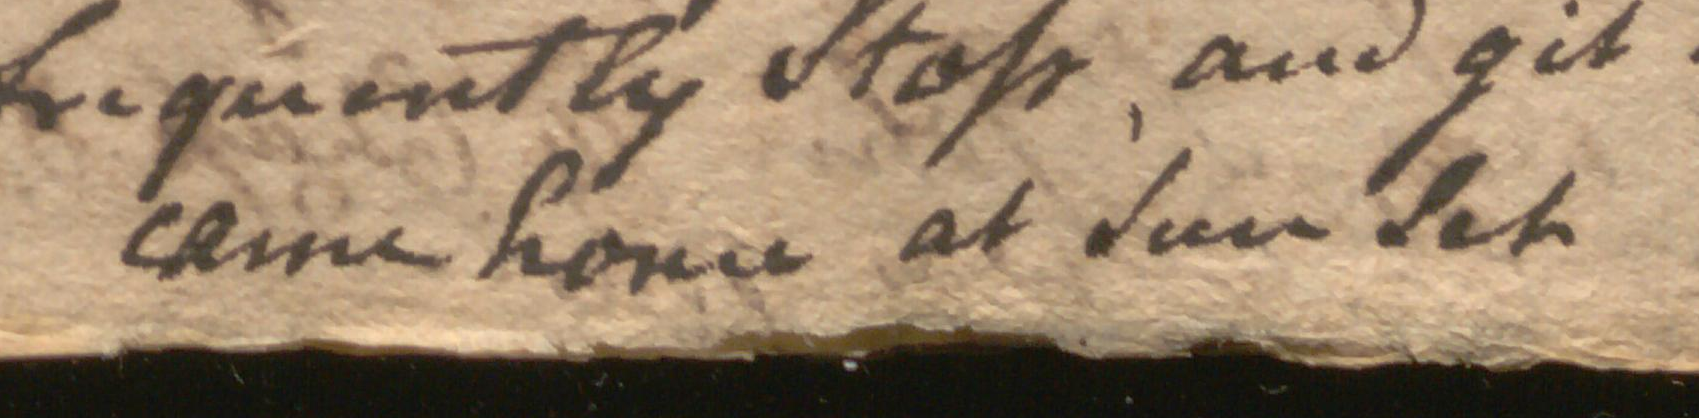came home at sun set
